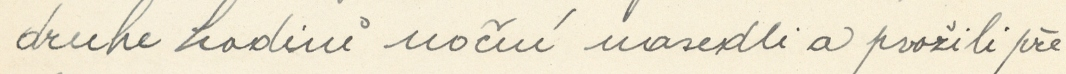druhe hodině noční nasedli a prožili pře-
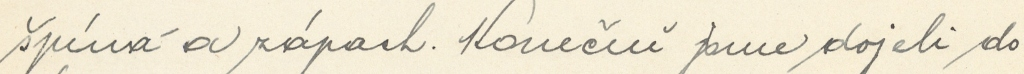špína a zápach. Konečně jsme dojeli do
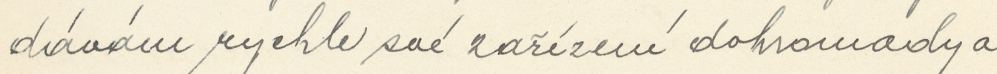dávám rychle své zařízení dohromady a
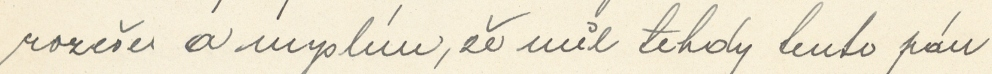rozešel a myslím, že měl tehdy tento pán
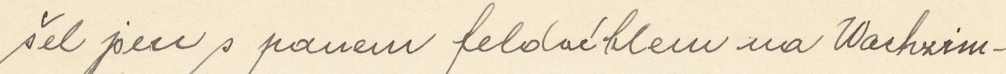šel jsem s panem feldvéblem na Wachzim-
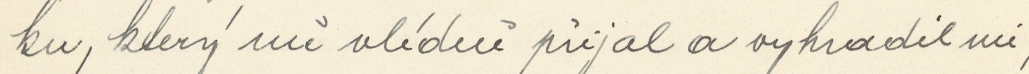ku, který mě vlídně přijal a vyhradil mi,
